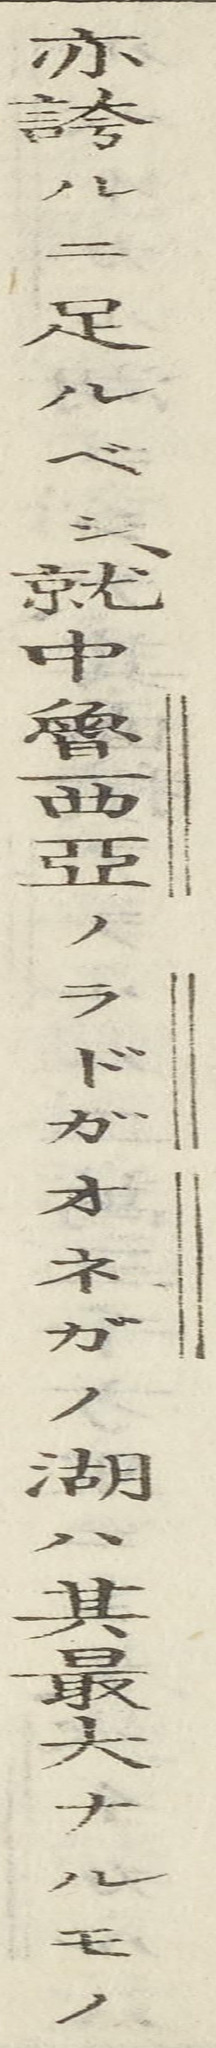亦誇ルニ足ルベシ、就中魯西亜ノラドガオネガノ湖ハ其最大ナルモノ
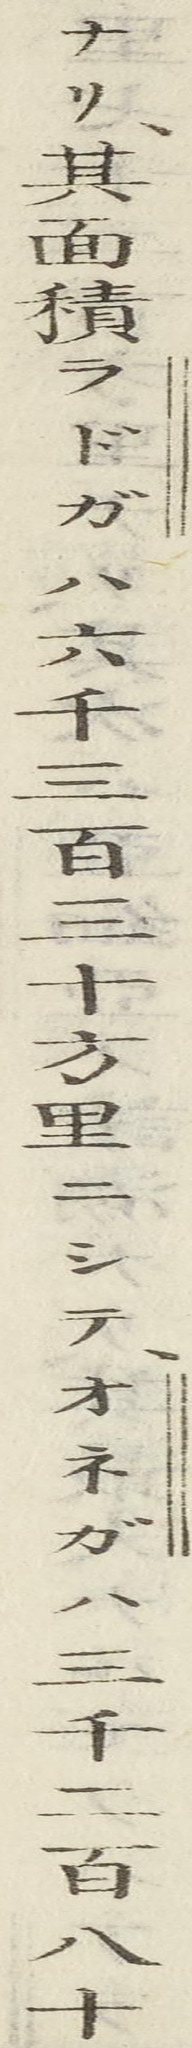ナリ、、其面積ラドガハ六千三百三十方里ニシテ、オネガハ三千二百八十
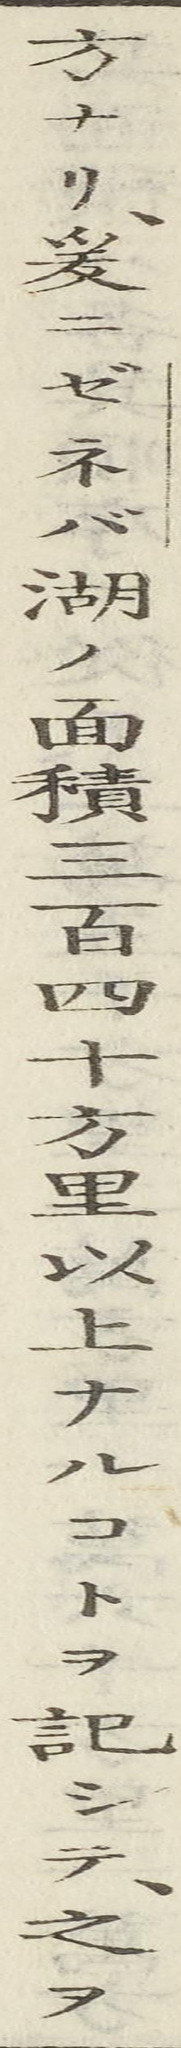方ナリ、爰ニゼネバ湖ノ面積三百四十方里以上ナルコトヲ記シテ、之ヲ
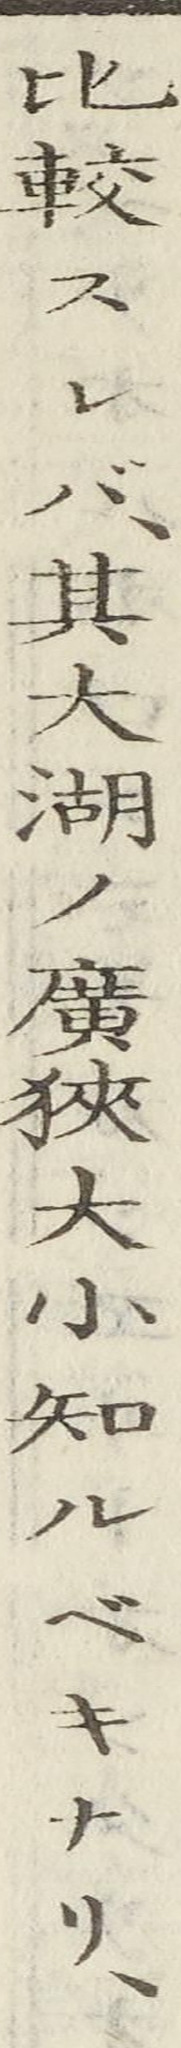比較スレバ、其大湖ノ広狭大小知ルベキナリ、
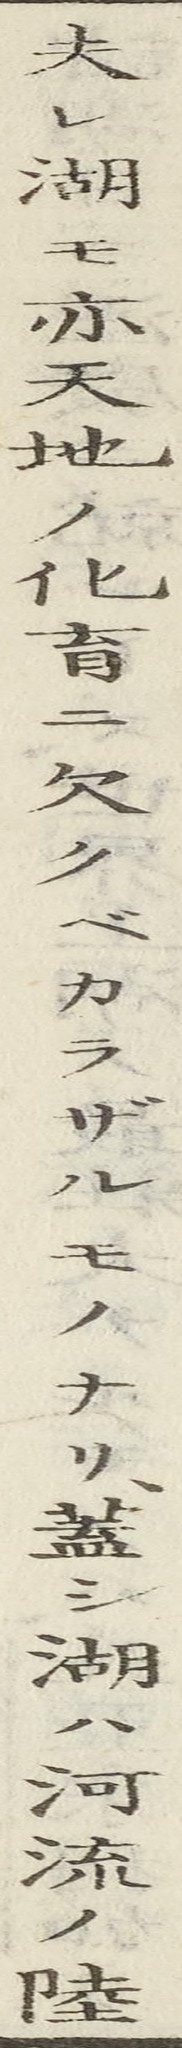夫レ湖モ亦天地ノ化育ニ欠クベカラザルモノナリ、蓋シ湖ハ河流ノ陸
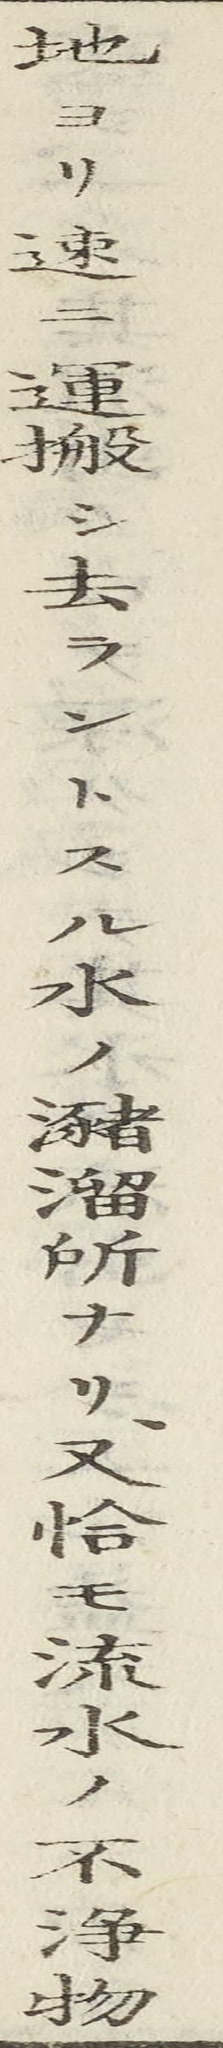地ヨリ速ニ運搬シ去ラントスル水ノ瀦溜所ナリ、又恰モ流水ノ不浄物
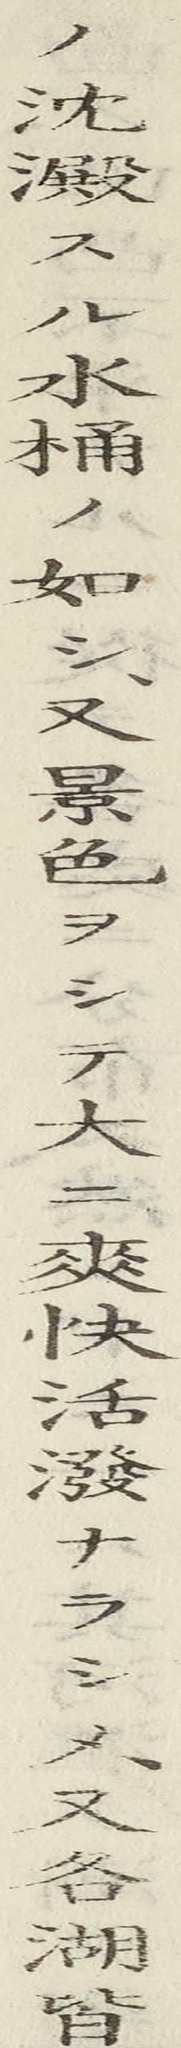ノ沈澱スル水桶ノ如シ、又景色ヲシテ大ニ爽快活潑ナラシメ、又各湖皆
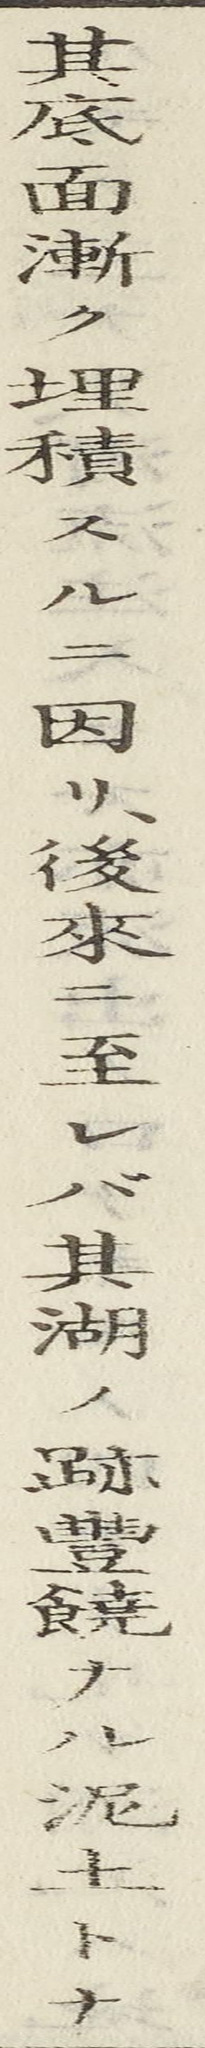其底面漸ク埋積スルニ因リ、後来ニ至レバ其湖ノ跡豊饒ナル泥土トナ
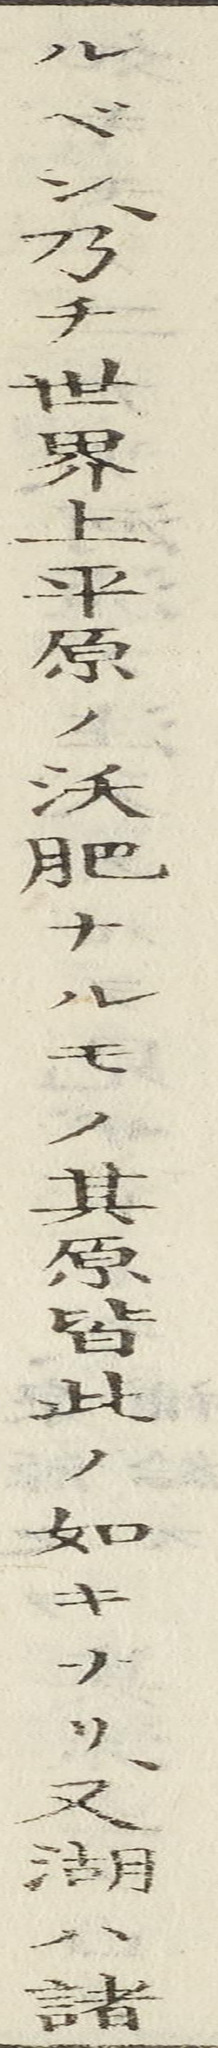ルベシ、乃チ世界上平原ノ沃肥ナルモノ其原皆此ノ如キナリ、又湖ハ諸
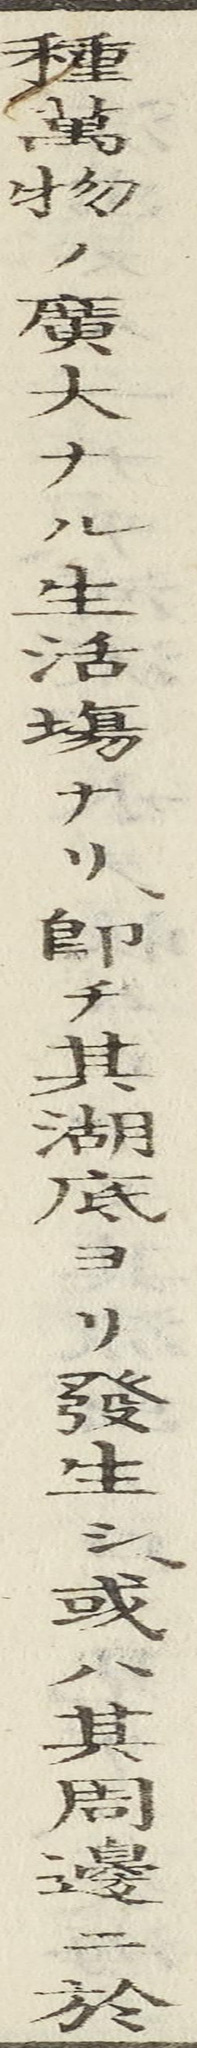種万物ノ広大ナル生活場ナリ、即チ其湖底ヨリ発生シ、或ハ其周辺ニ於
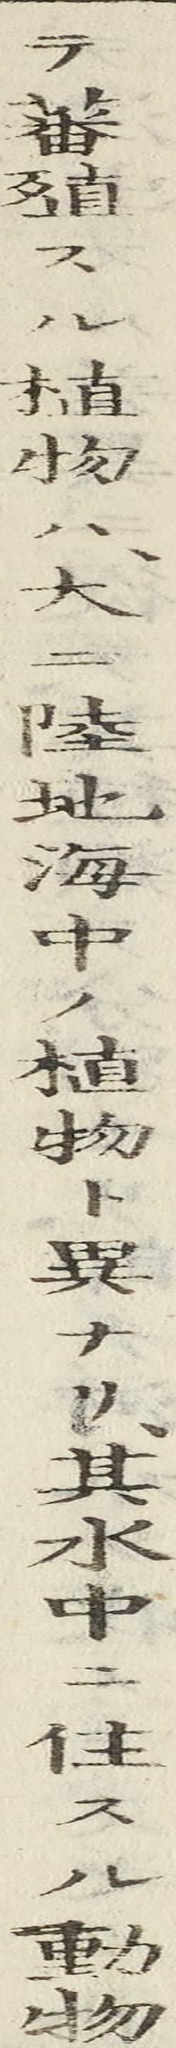テ蕃殖スル植物ハ、大ニ陸地海中ノ植物ト異ナリ、其水中ニ住スル動物
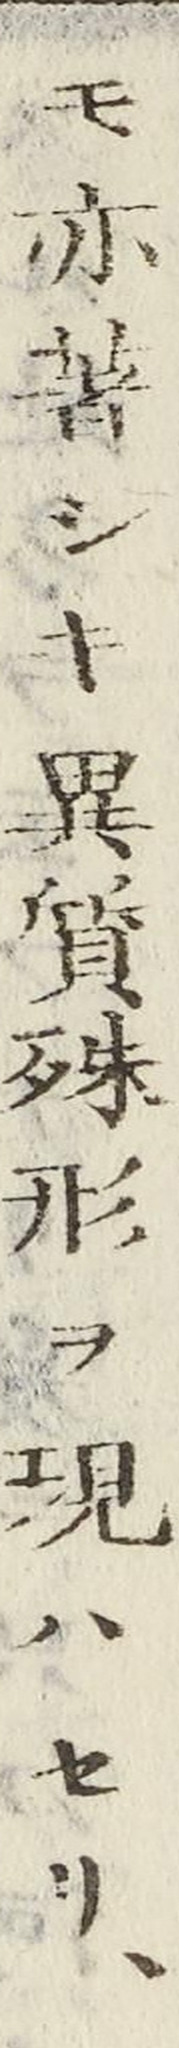モ亦著シキ異質殊形ヲ現ハセリ、
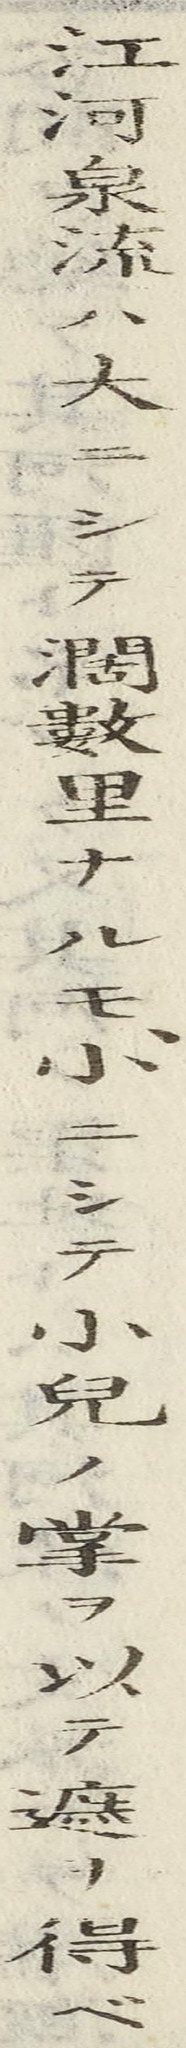江河泉流ハ大ニシテ濶数里ナルモ、小ニシテ小児ノ掌ヲ以テ遮ノ得ベ
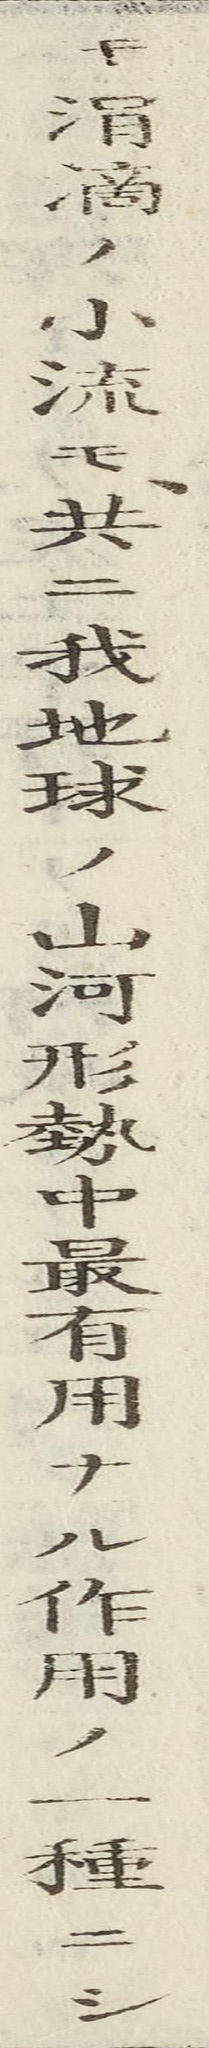キ涓滴ノ小流モ、共ニ我地球ノ山河形勢中最有用ナル作用ノ一種ニシ
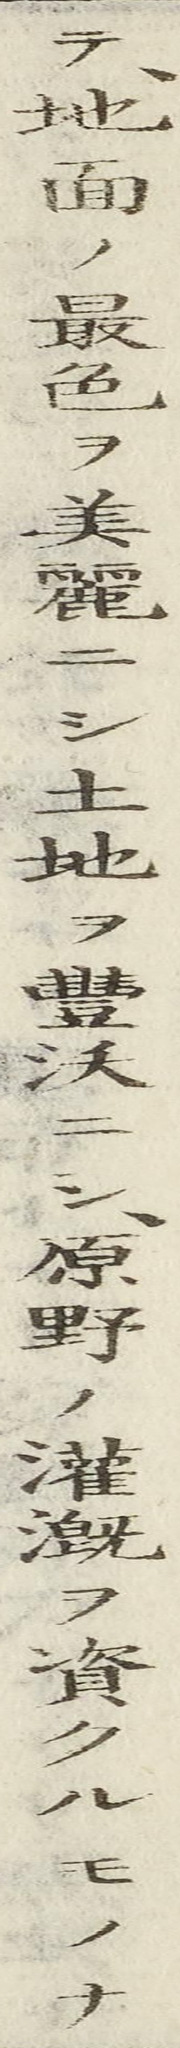テ、地面ノ景色ヲ美麗ニシ土地ヲ豊沃ニシ、原野ノ灌漑ヲ資クルモノナ
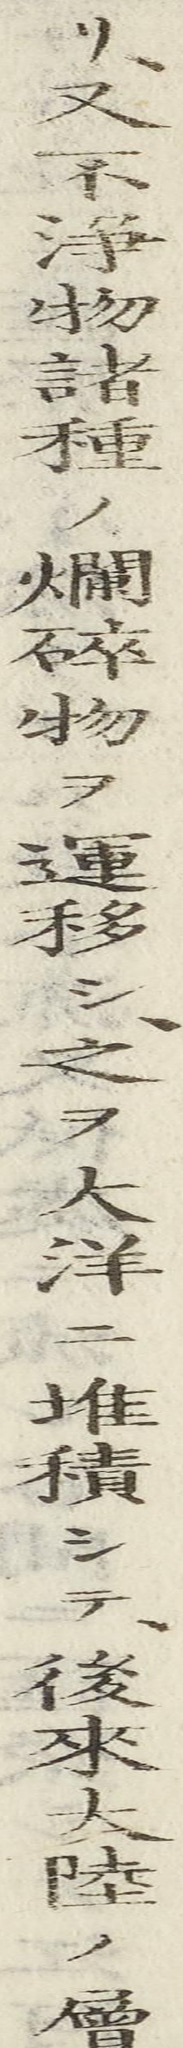リ、又不浄物諸種ノ爛砕物ヲ運移シ、之ヲ大洋ニ堆積シテ、後来大陸ノ層
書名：百科全書　地文學　全
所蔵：東京大学地震研究所図書室 Earthquake Research Institute Library, The University of Tokyo, JAPAN
